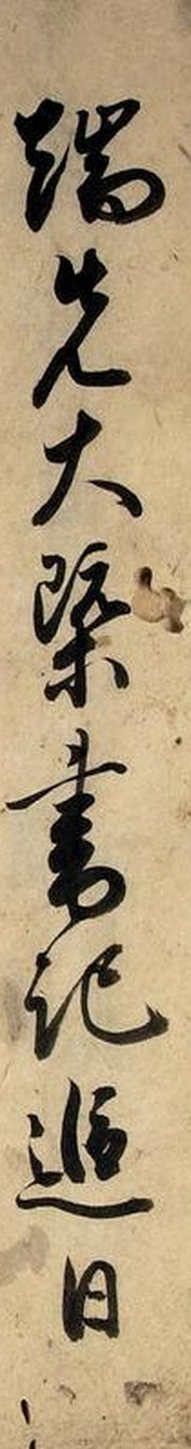端先大概書記追日
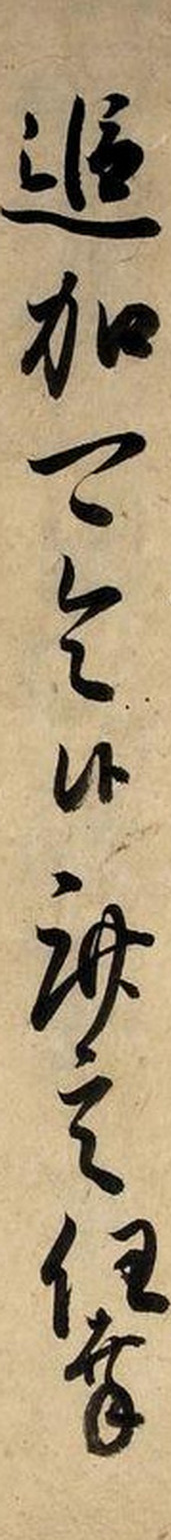追加可令候謹言任幸
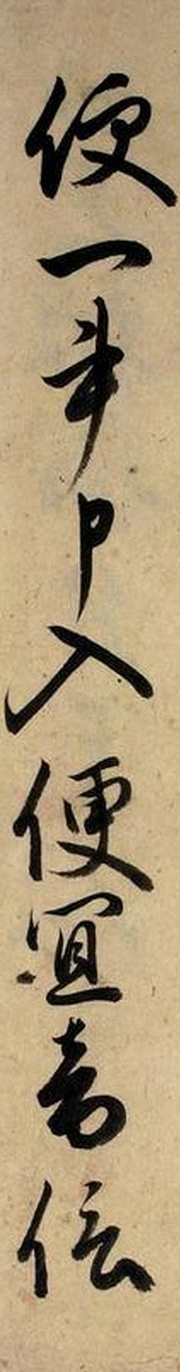便一書申入便宜音信
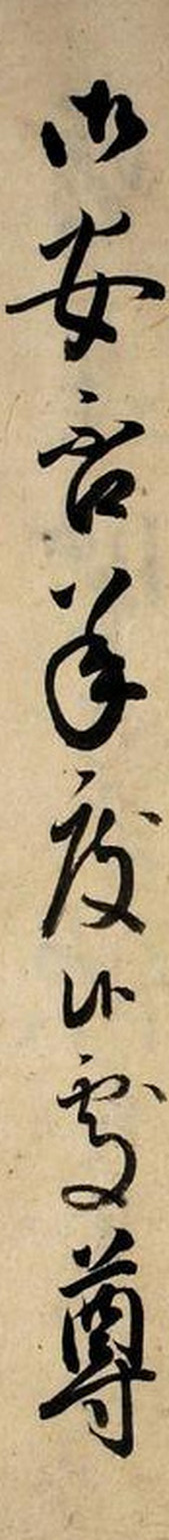御安否承度候処尊
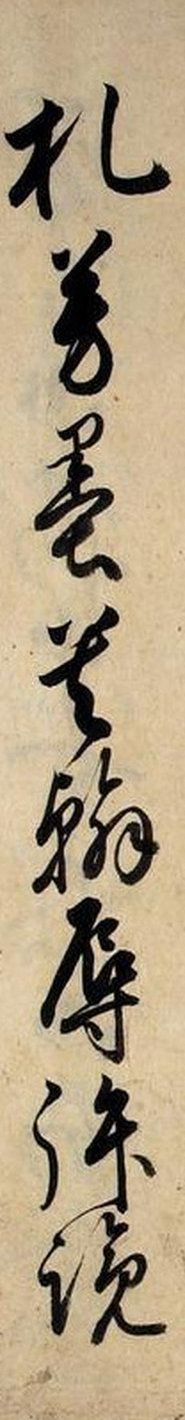札芳墨貴翰辱拝覧
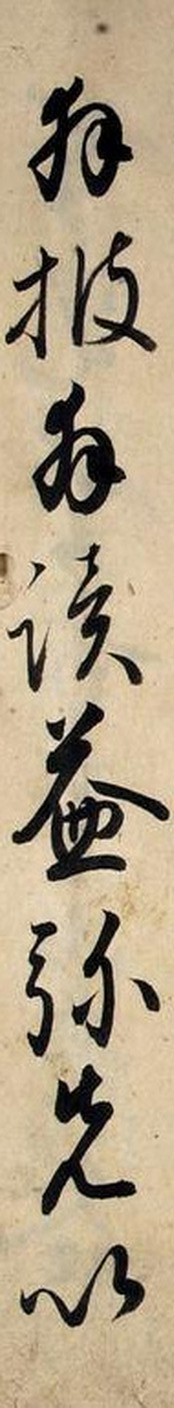拝披拝読益弥先以

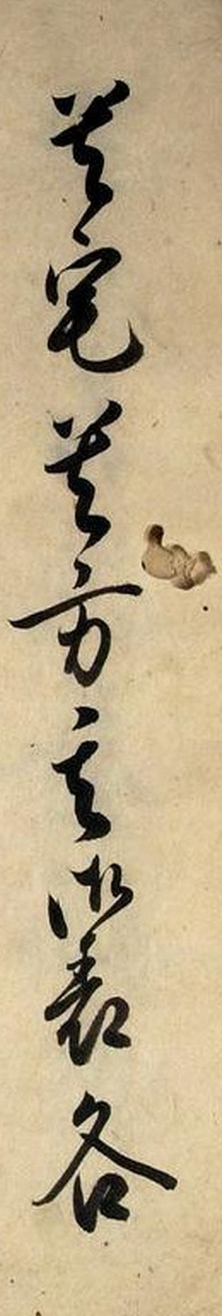貴宅貴方其御表各
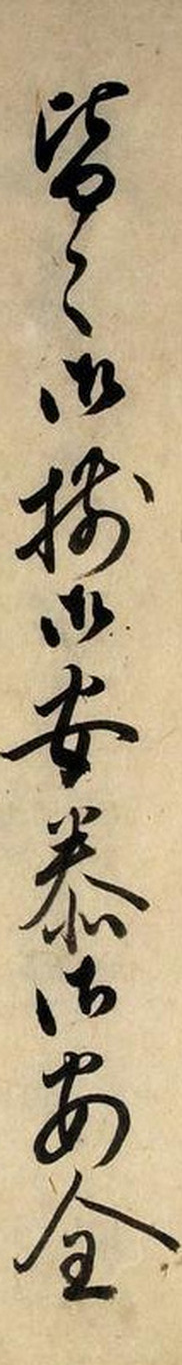皆々御揃御安泰御安全
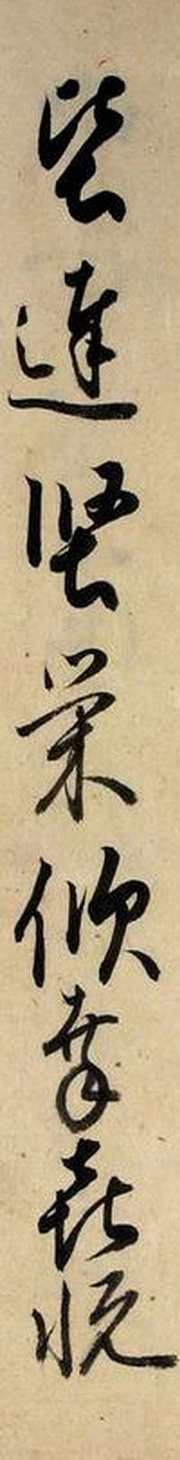堅達堅栄欣幸喜悦
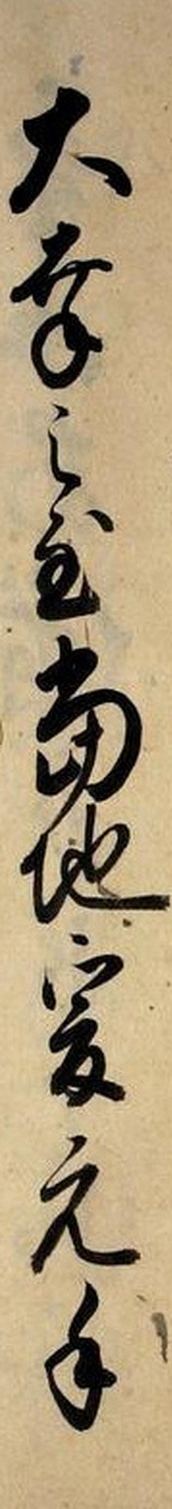大幸之至当地爰元手
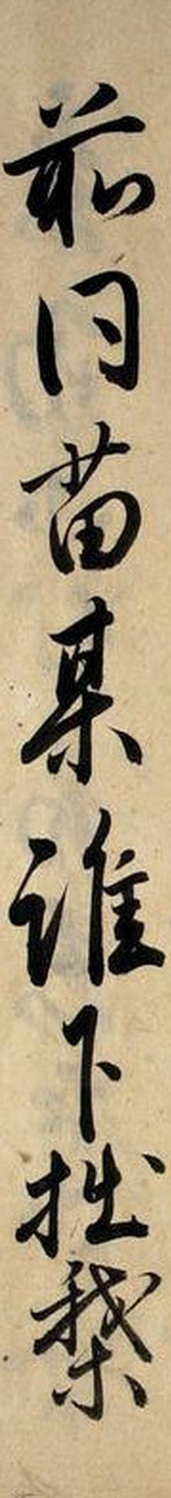前同苗某誰下拙我等
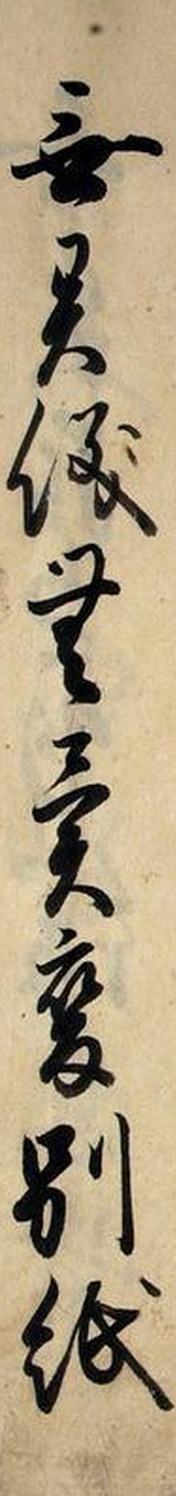無異儀無異変別紙

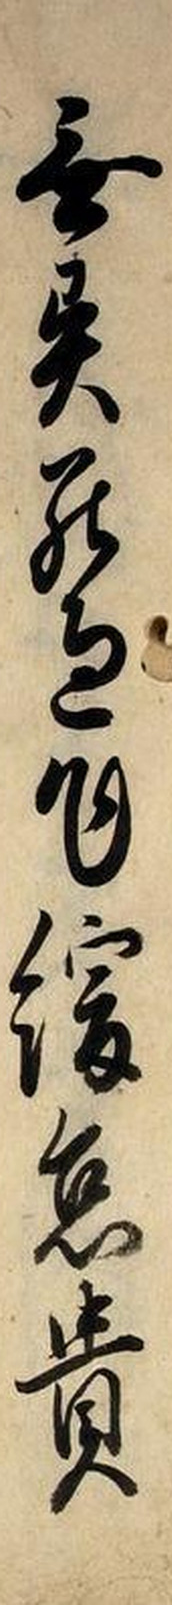無異罷過乍緩怠貴
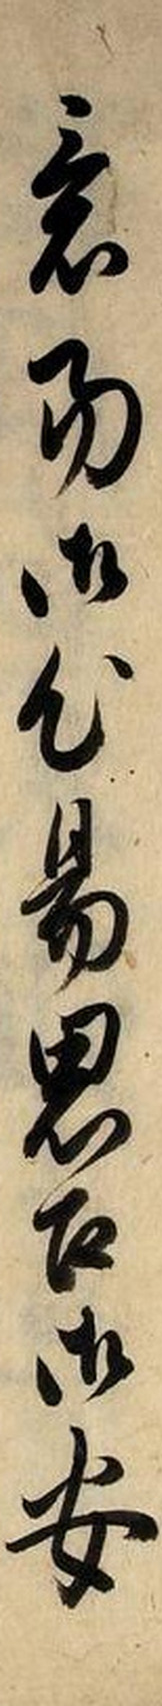意易御心易思召御安
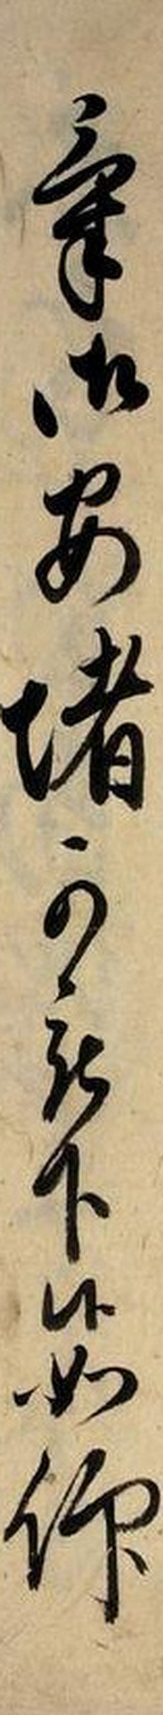気御安堵可被下候如仰
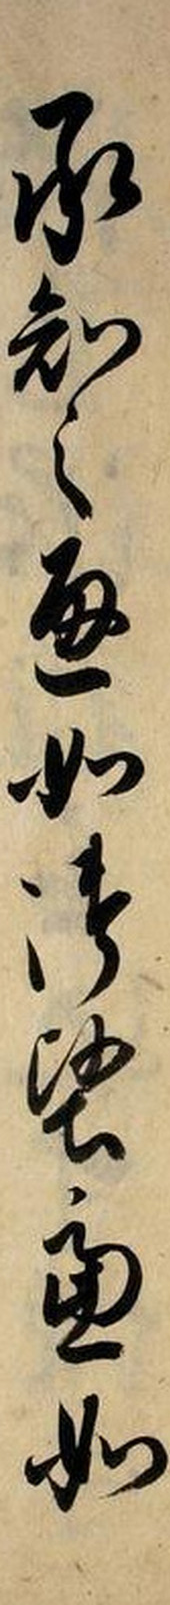承知之通如御堅慮如
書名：消息千字文（往来物、手習手本）
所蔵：福井県文書館 Fukui Prefectural Archives
